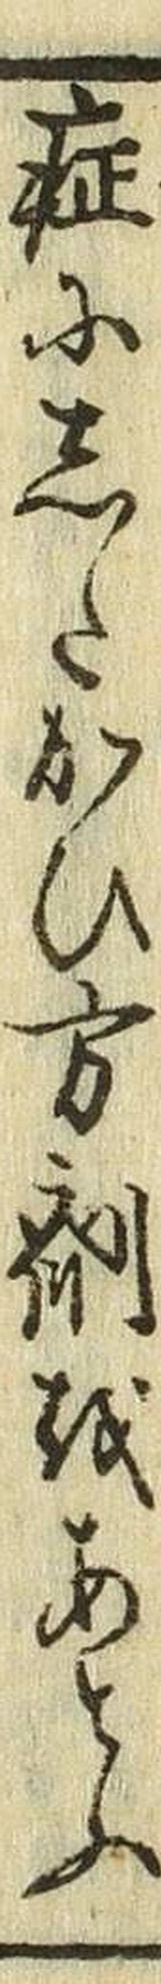症にしたがひ方剤をあとふ
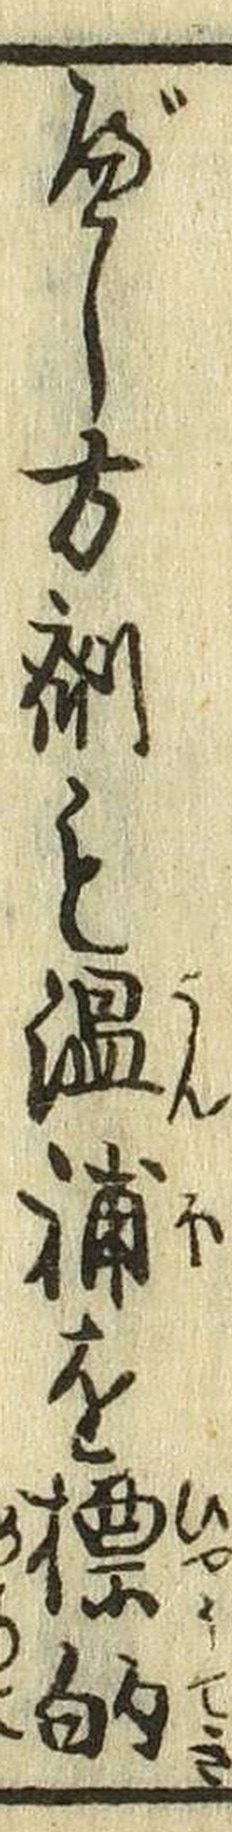べし方剤も温補を標的
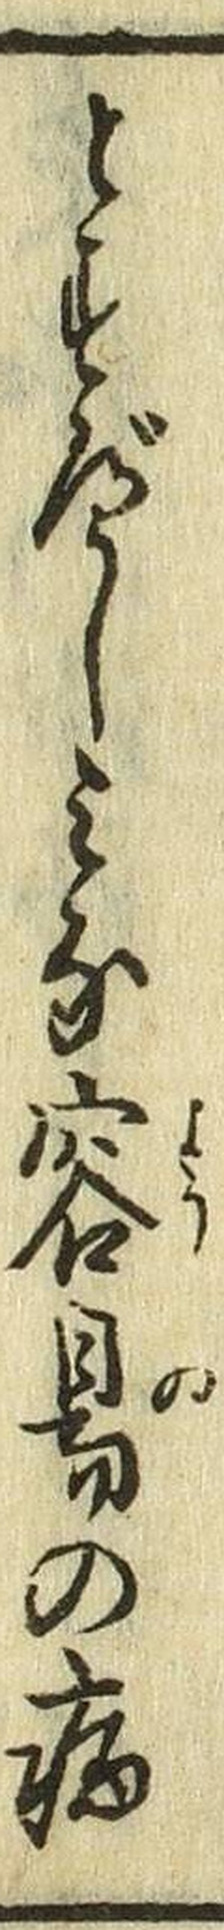とすべしみな容易の病
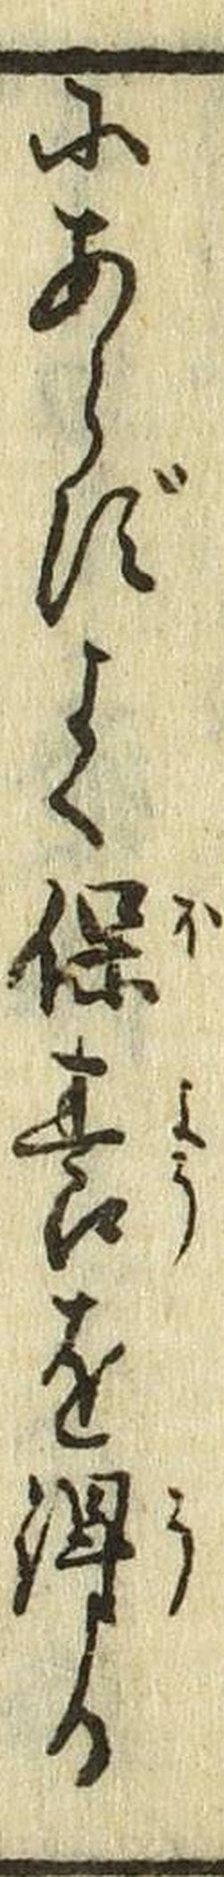にあらずよく保養を得る
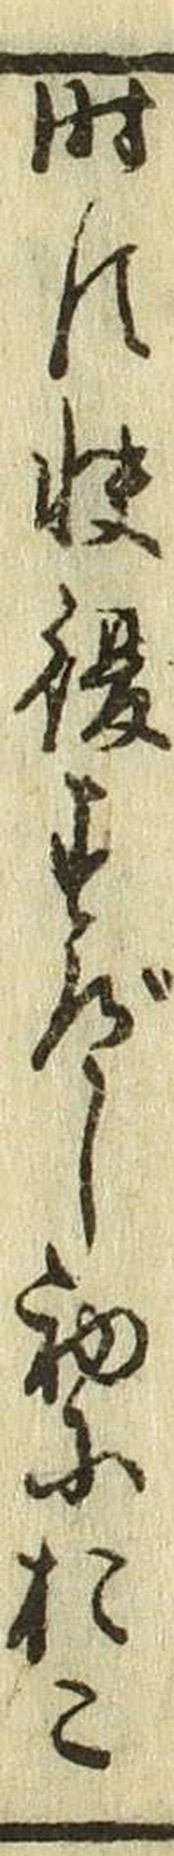時は快復すべし初におこ
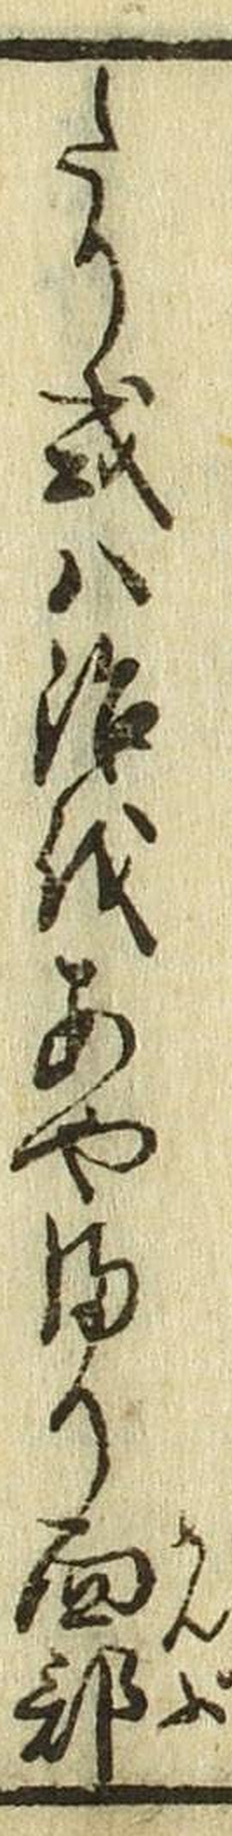たり或は治をあやまり面部
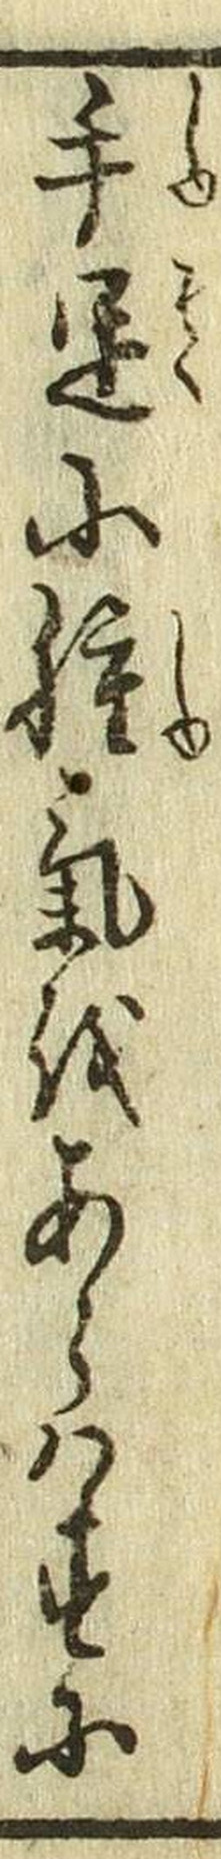手足に腫気をあらはすに
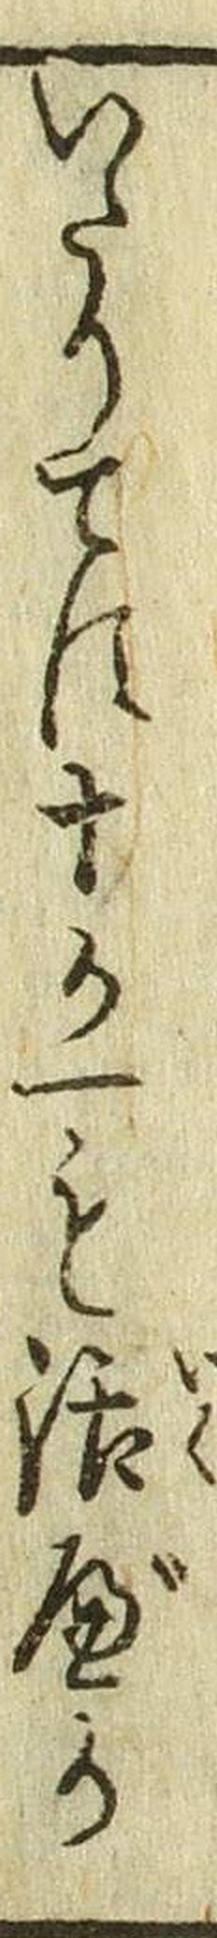いたりては十か一も活べか
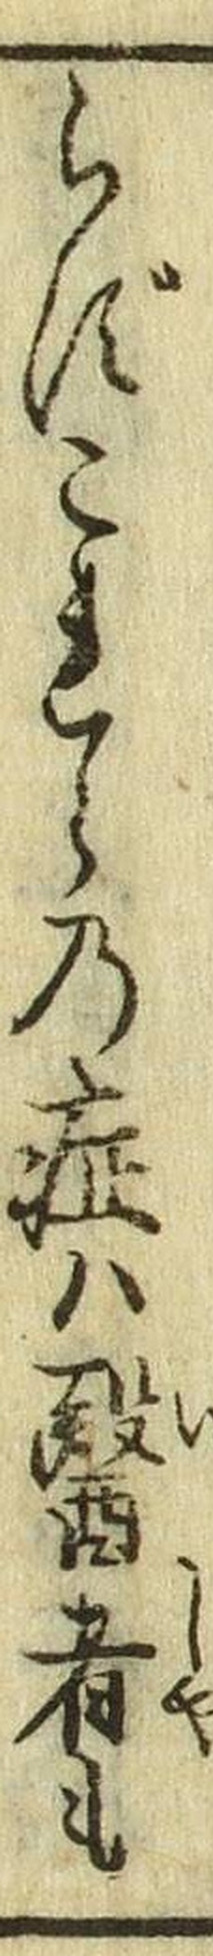らずこれらの症は医者も

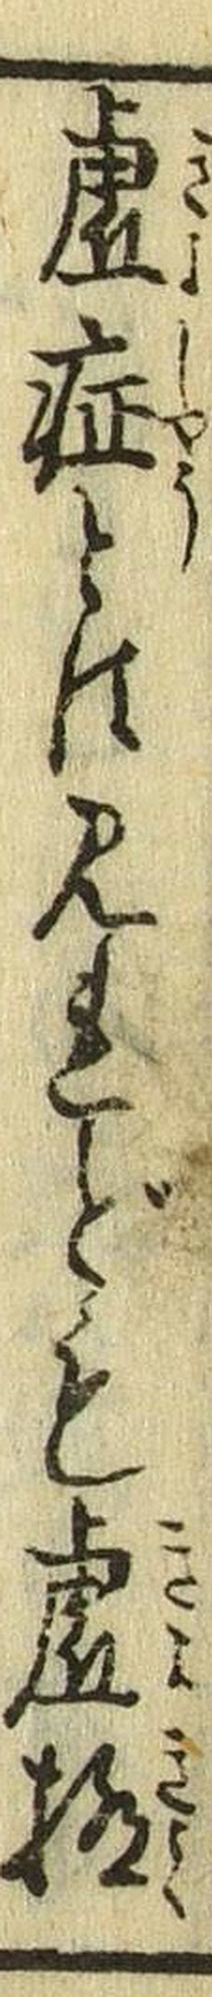虚症とは見れども虚極
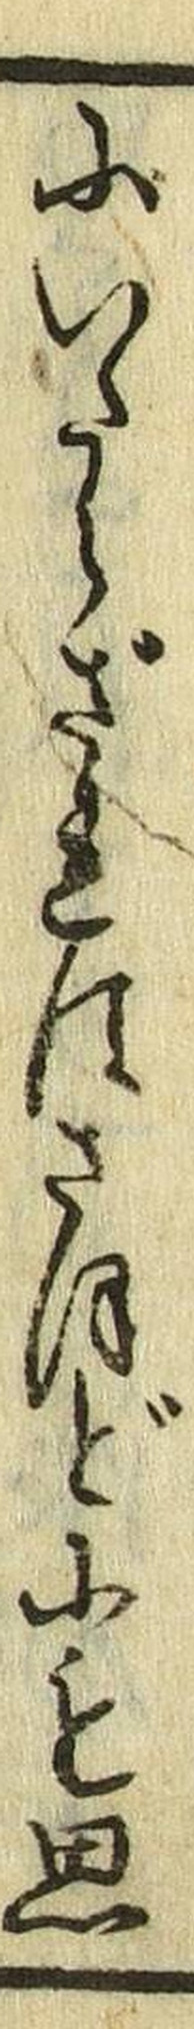にいたらざれはさほどにも思
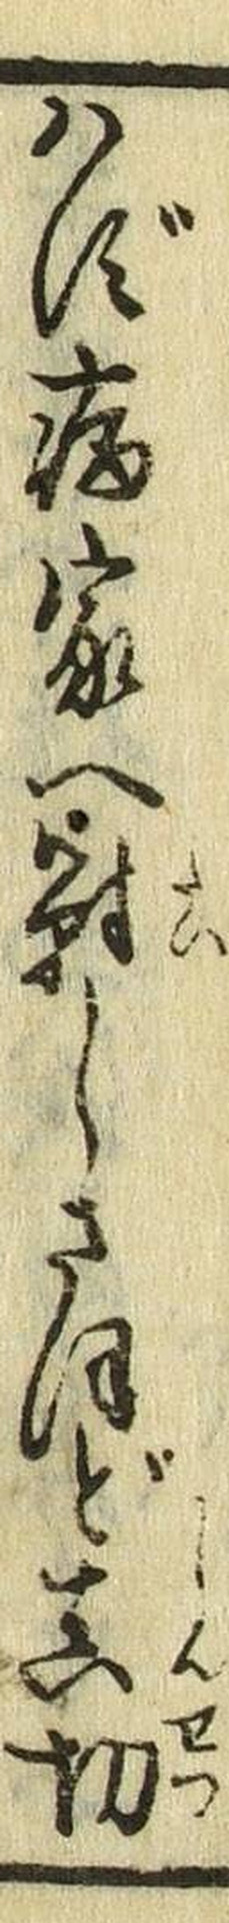はず病家へ対しさほど真切
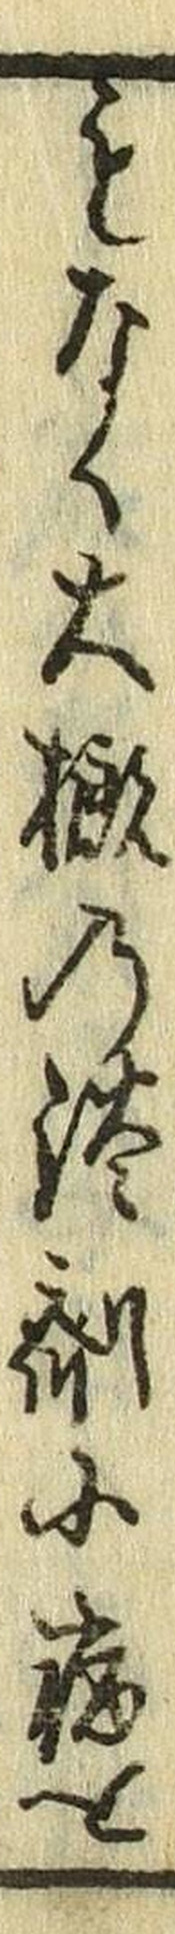もなく大概の淡剤に病を
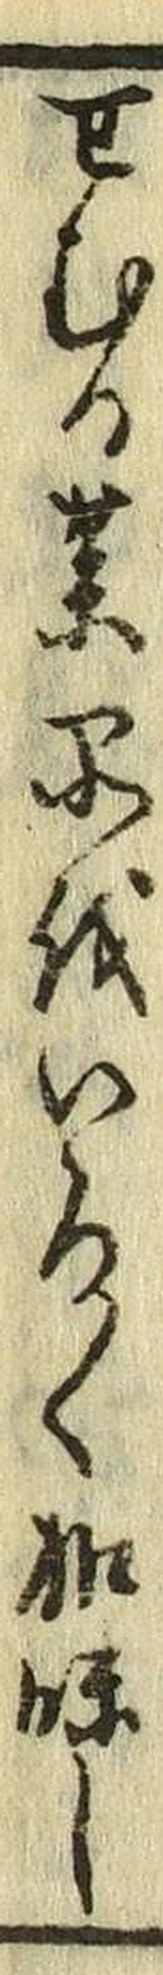せむる薬品をいろ〳〵加味し
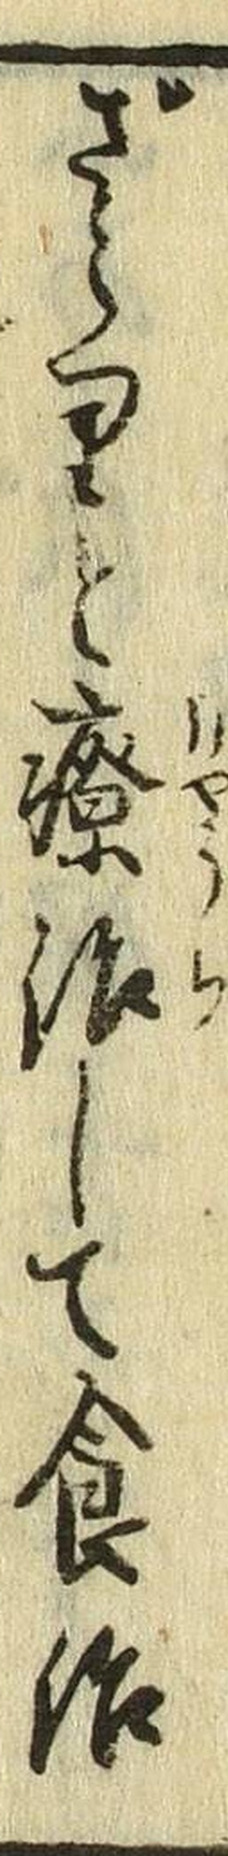ざらりと療治して食治
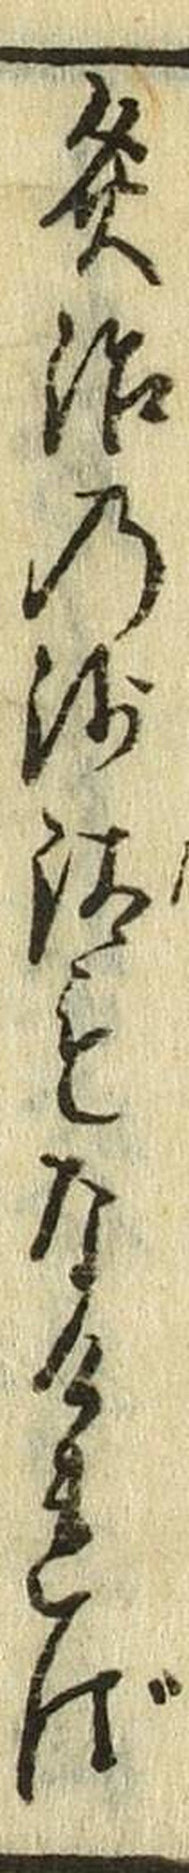灸治の沙汰もなければ
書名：居家養生記
